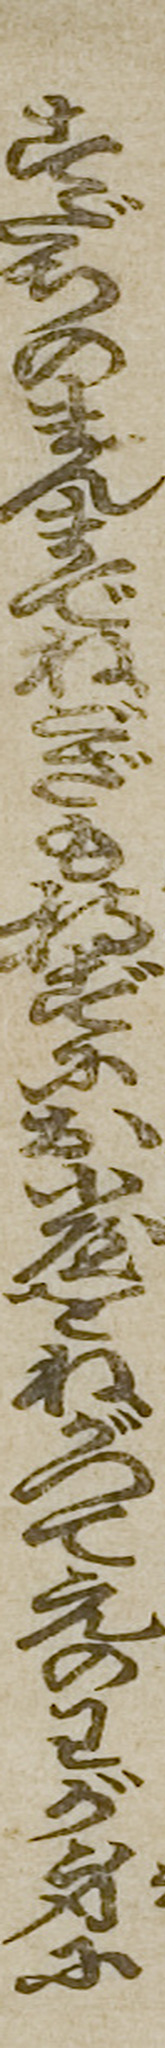すだちのまんまでねござも持ずにお小屋をねがつて元のわが身に
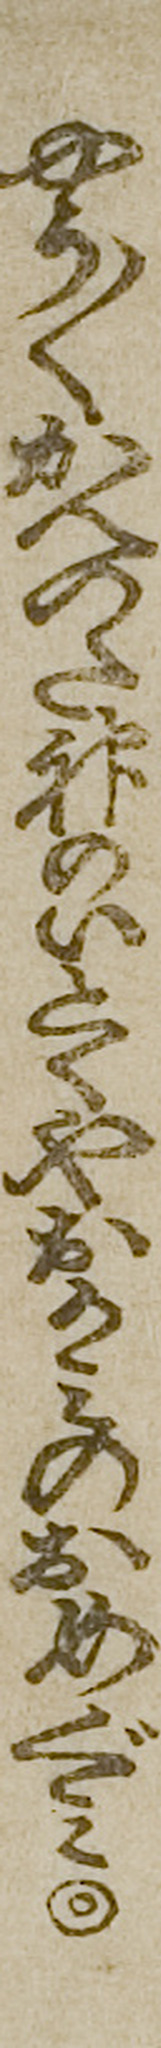やう〳〵かへつた神のいとくやおかみのおめぐみ◎
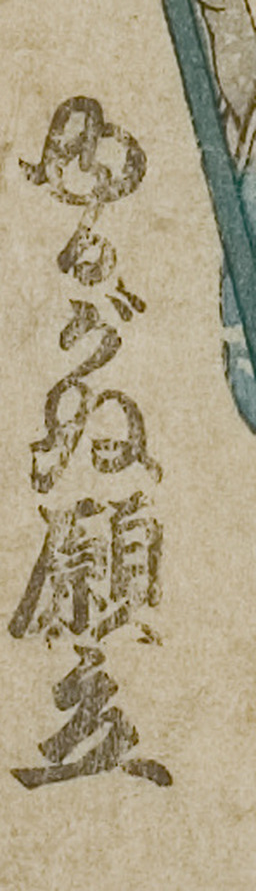ゆるがぬ願立
